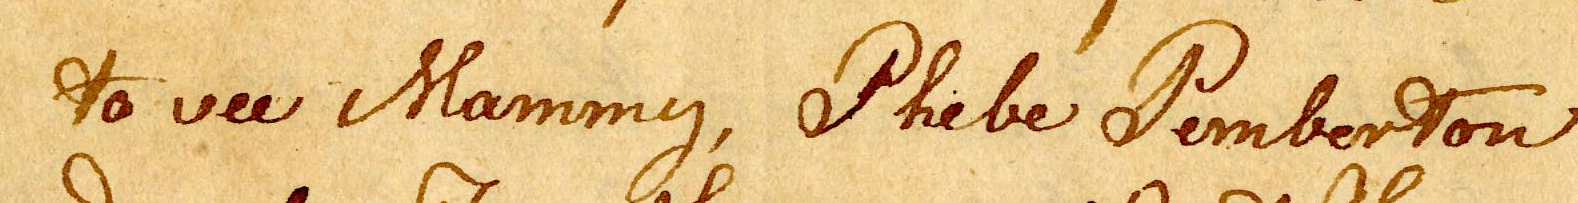to see Mammy, Phebe Pemberton
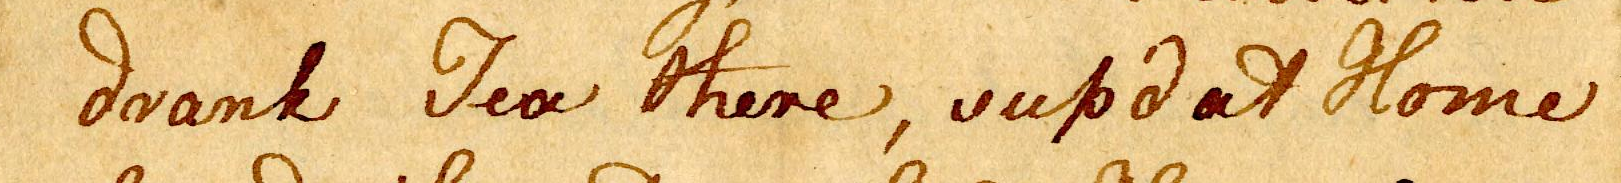drank Tea there, supd at Home
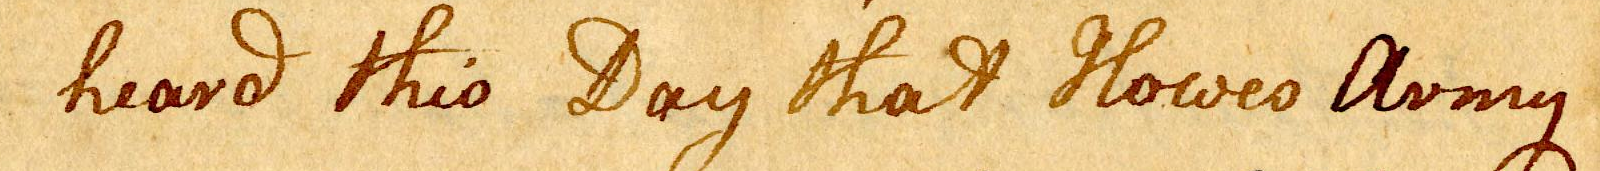heard this Day that Howes Army
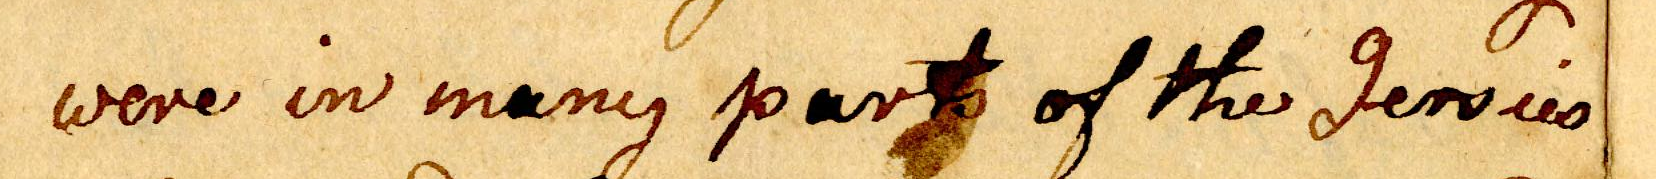were in many parts of the Jersies
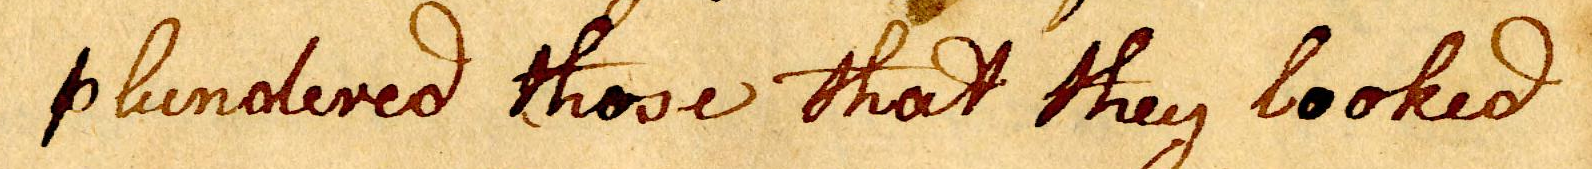plundered those that they looked
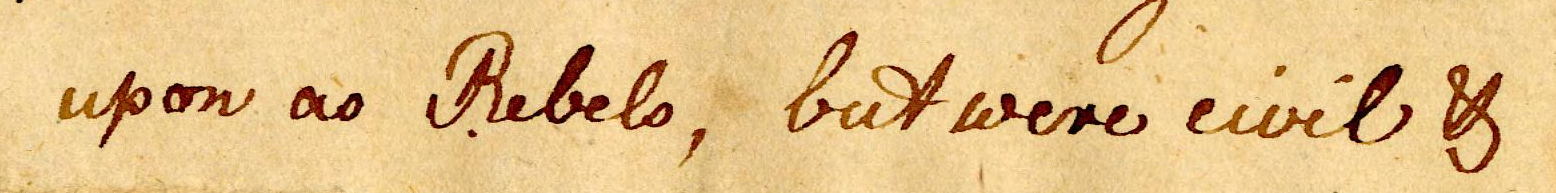upon a Rebels, but were civil &
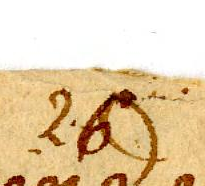26
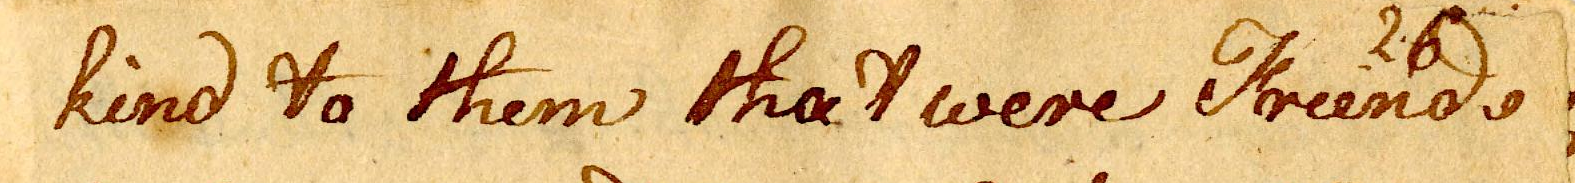kind to them that were Friends
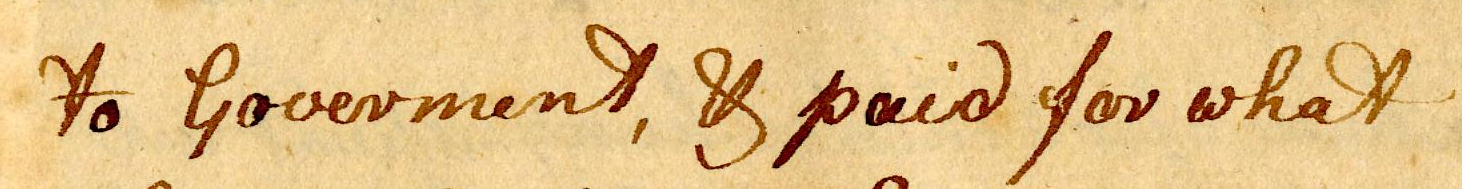to Government, & paid for what
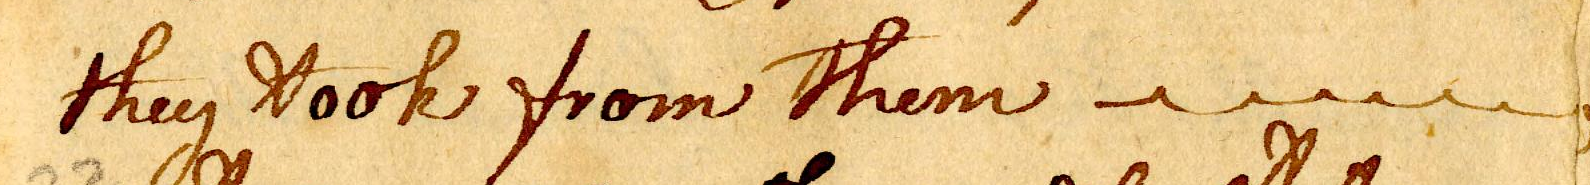they took from them-
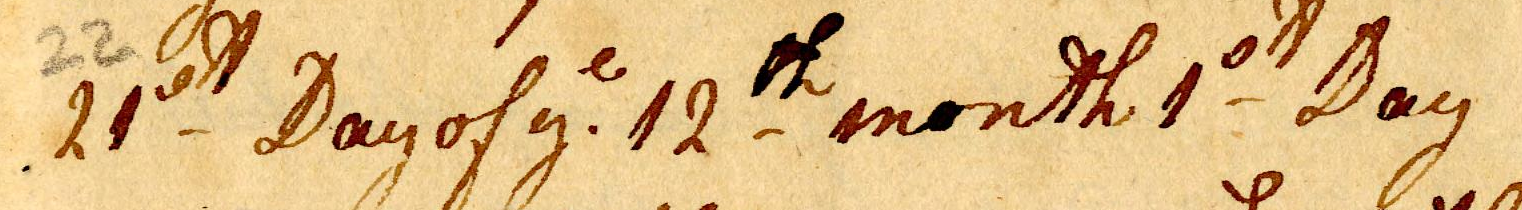21^st Day of y^e 12^th month 1^st Day
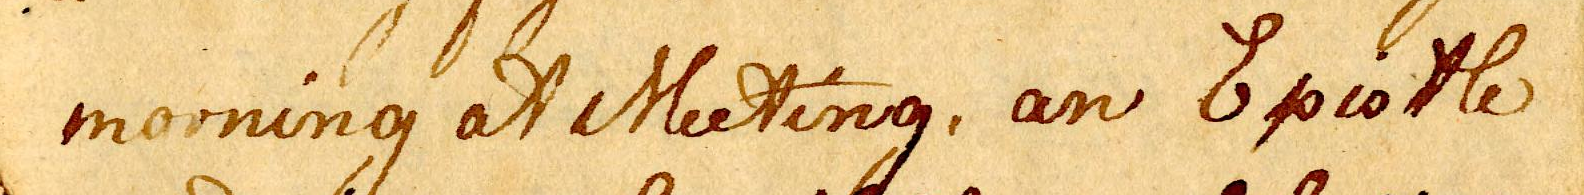morning at Meeting, an Epistle
